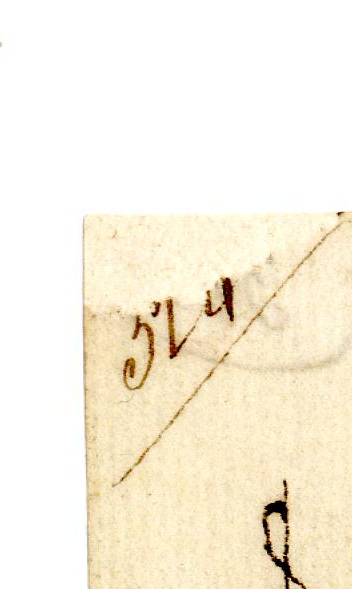324
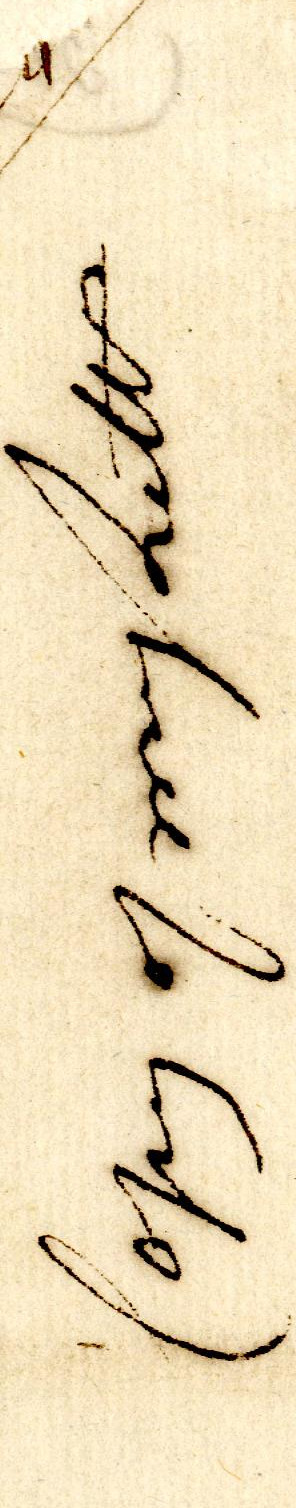Copy of my Letter
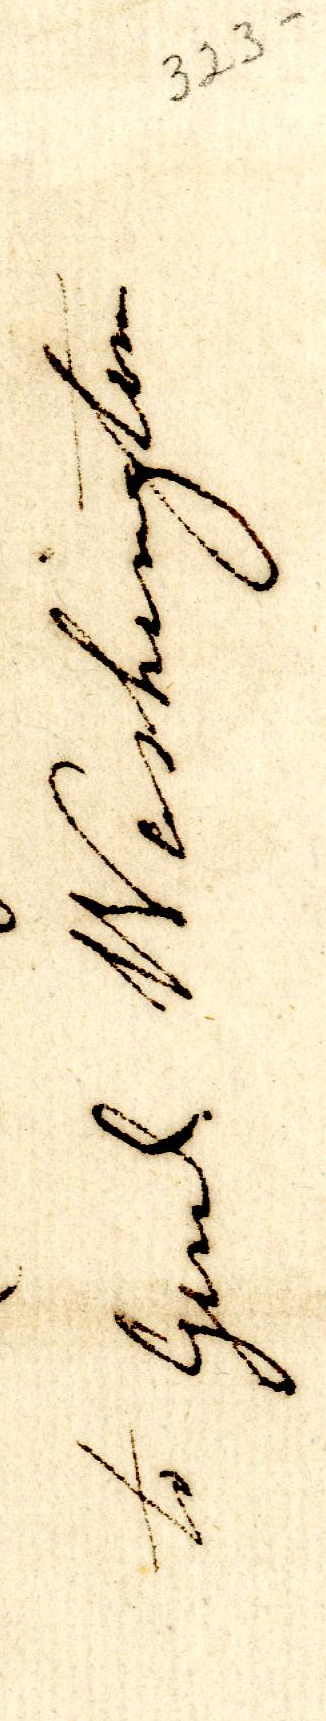to Gen^l. Washington
